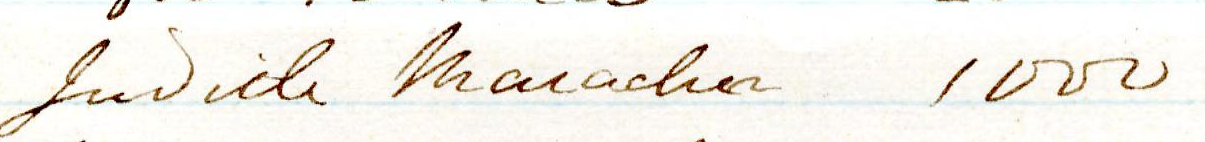Judith Maracher 1000
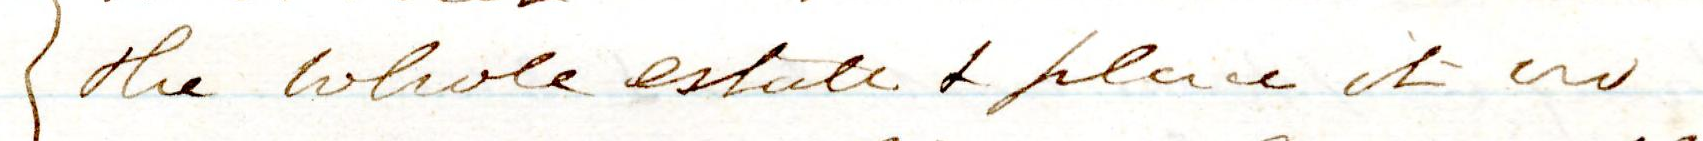the whole estate & please it no
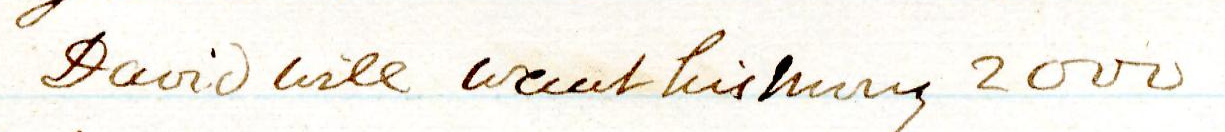David Will recent his mony 2000
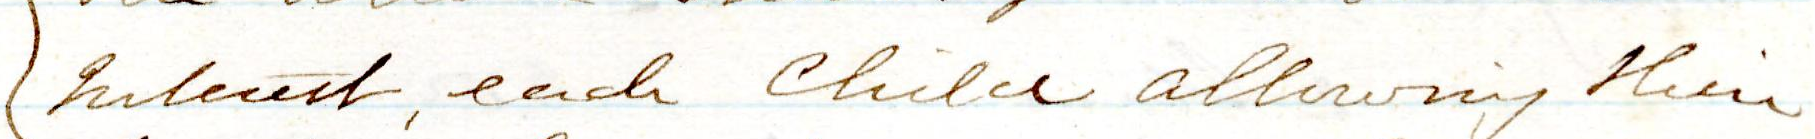Interest, each Child allowing him
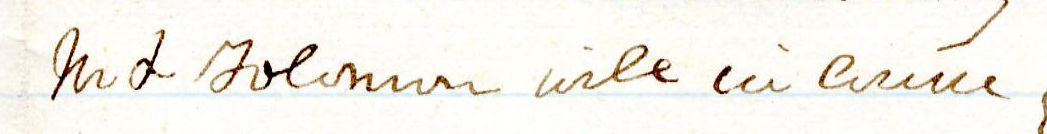Ned Soloman will increase
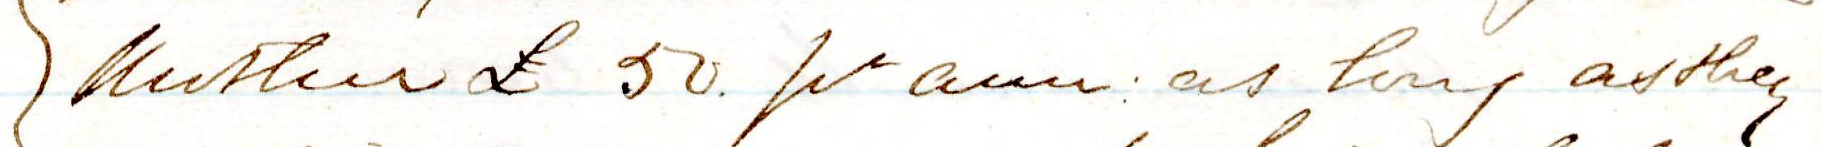Nuther £50. per acre: as long as they
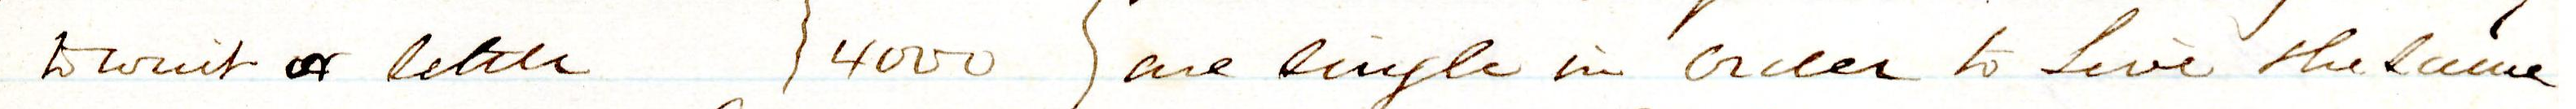in writ or letter 4000 are single in order to Live the same
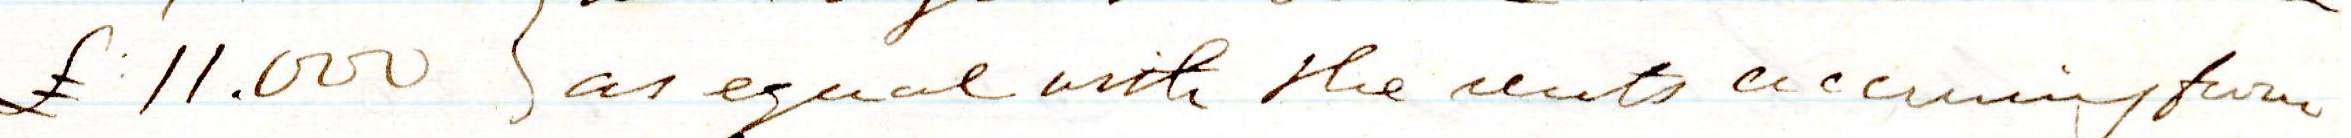£11.000 as equal with the rents accruing from
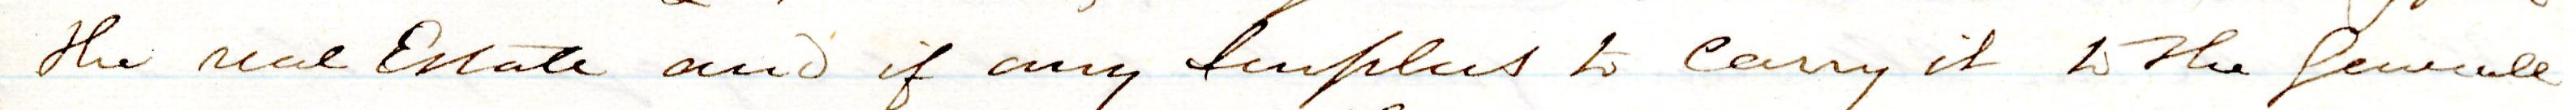the real Estate and if any surplus to carry it is the Generall
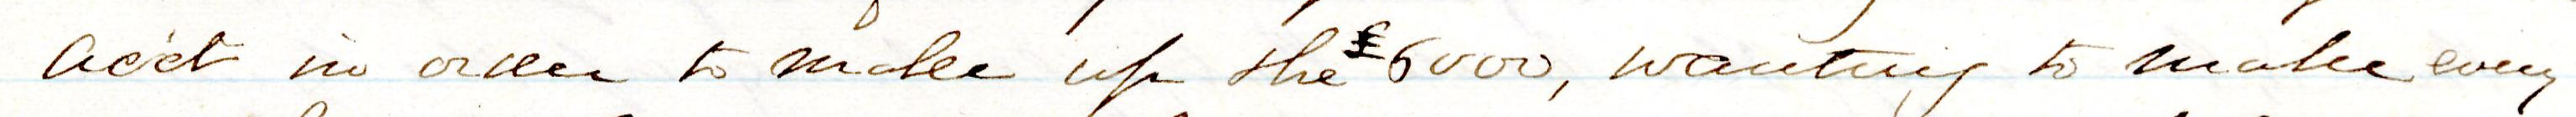acct in order to make up the £6000, wanting to make every
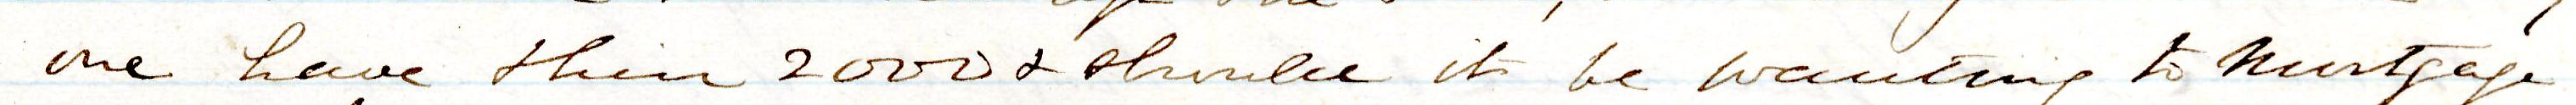one have their 2000 & should it be waiting to mortgage
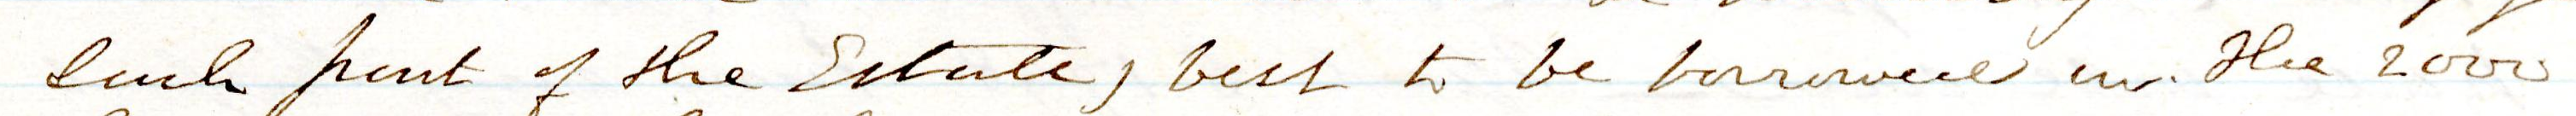such part of the Estate, but to be borrowed in the 2000
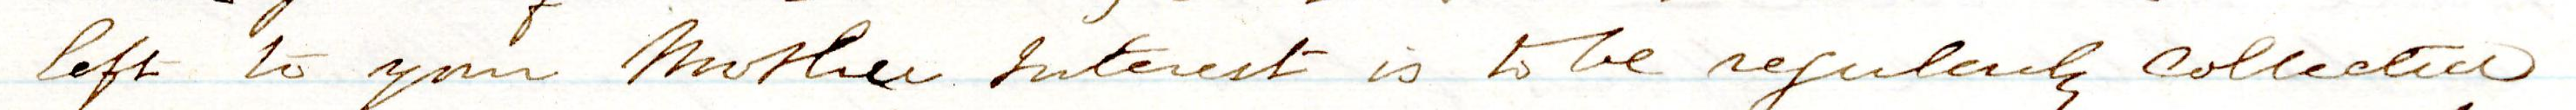left to your Mother interest is to be regularly collected
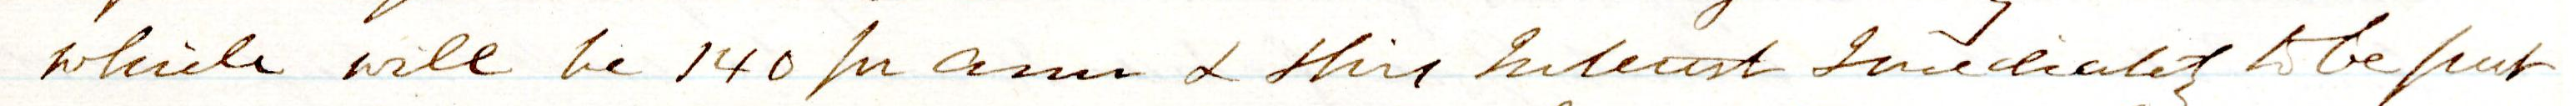which will be 140 pr anum & this interest Imediatly to be put
